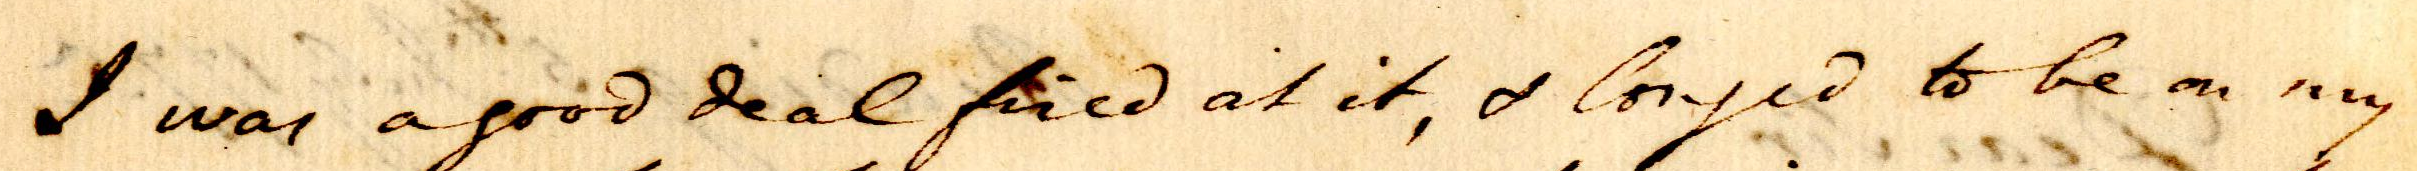I was a good deal fired at it, & Conyed to be on my
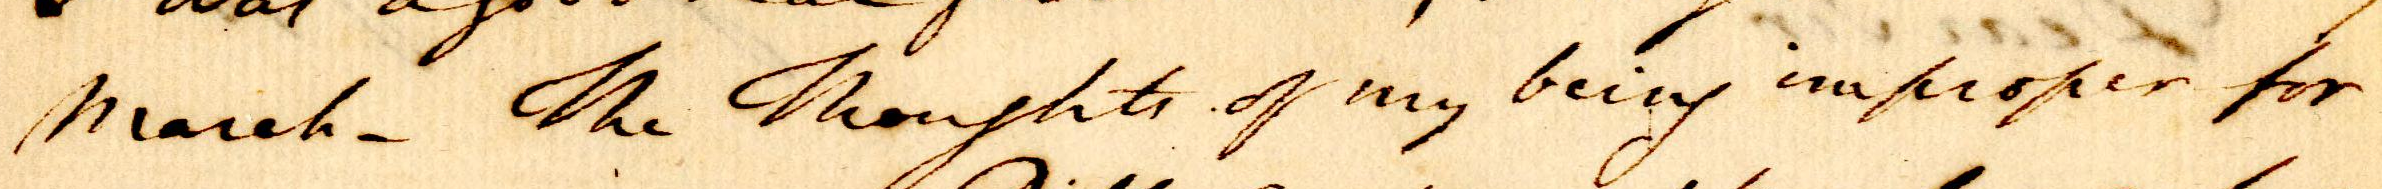March. The Thoughts of my being improper for
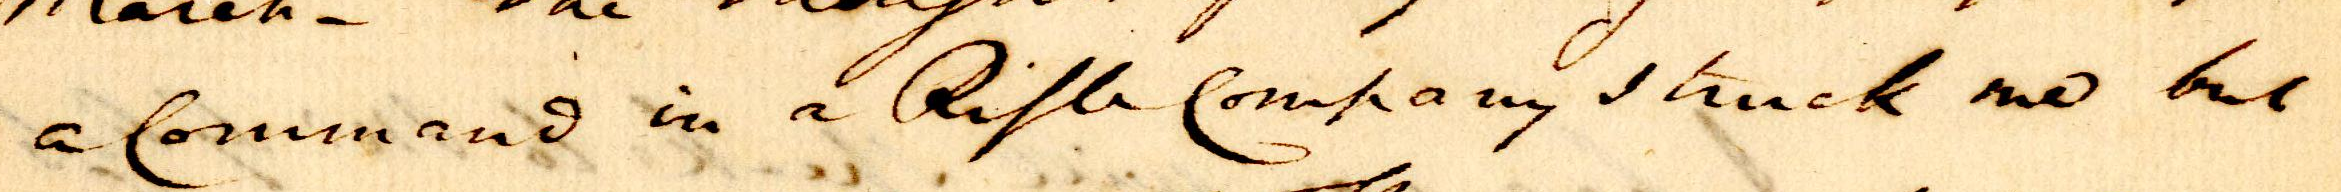a Command in a Rifle Company struck me but
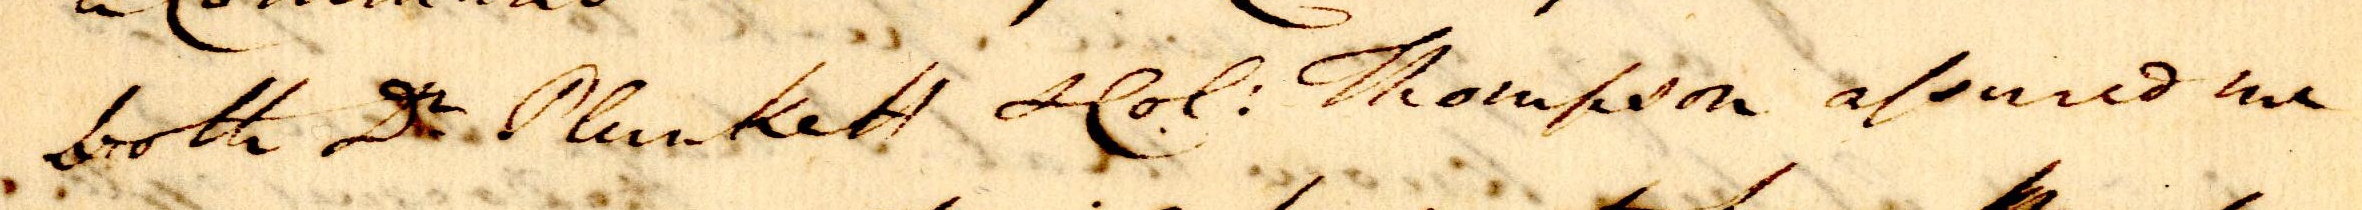both D^r. Plunkett & Col: Thompson assured me
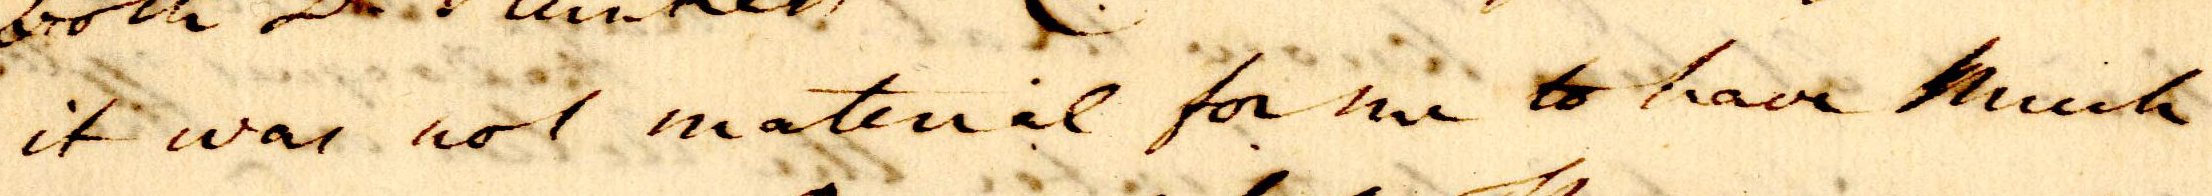it was not material for me to have Much
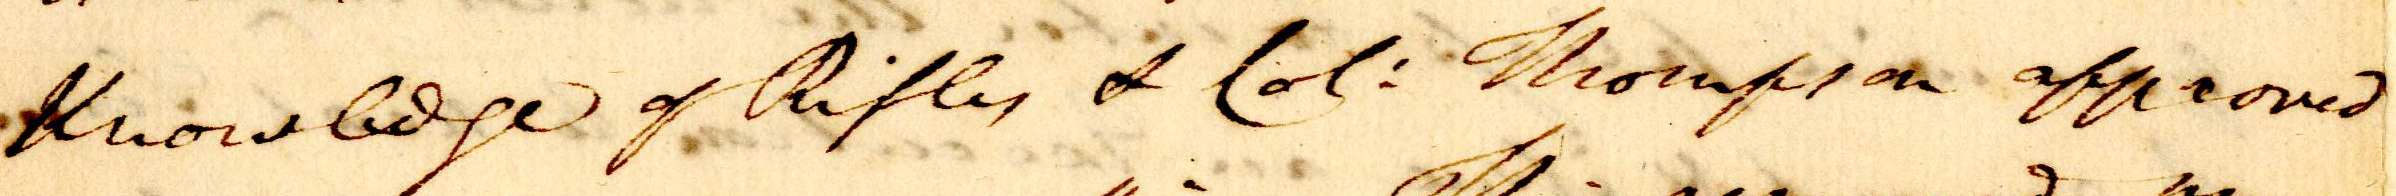Knowledge of Rifles & Col: Thompson approved
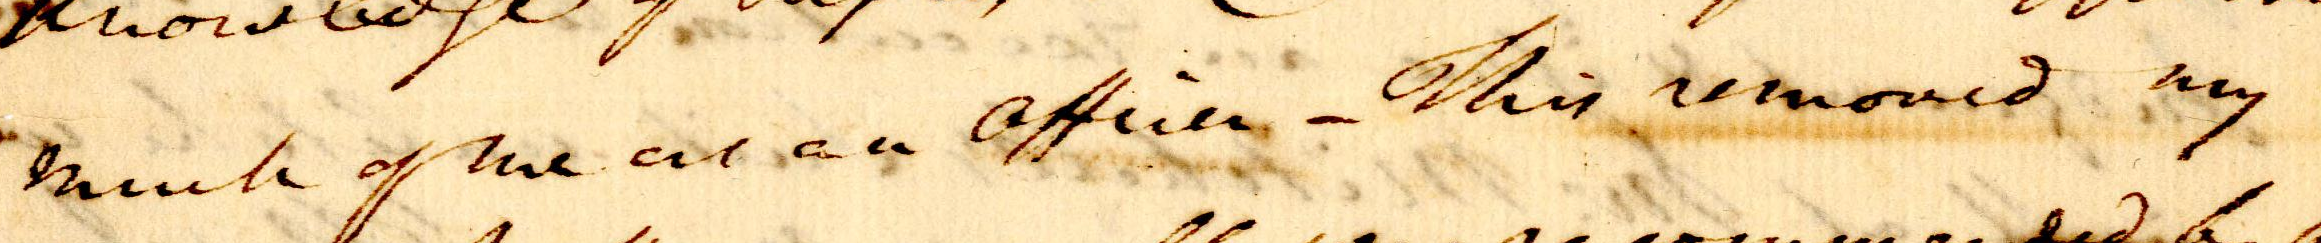much of me as an Officer. This removed my
